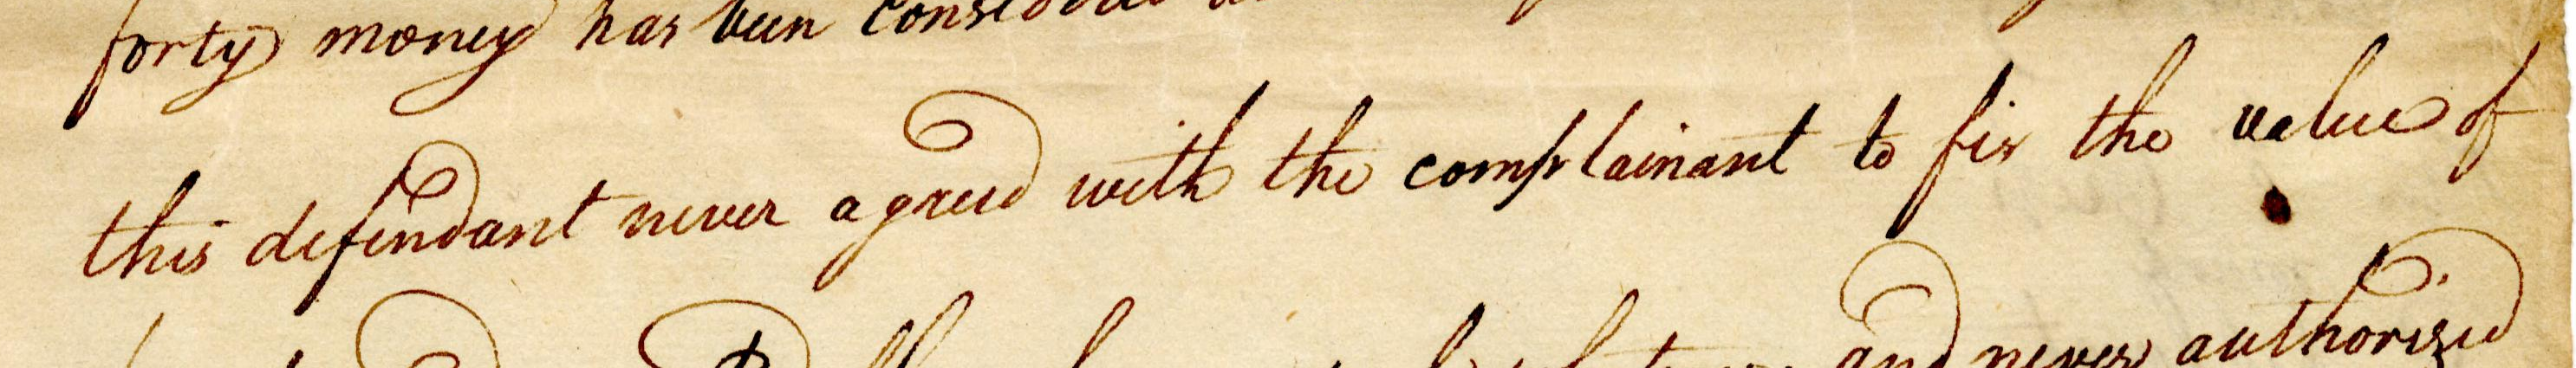this defendant never agreed with the complainant to fix the value of
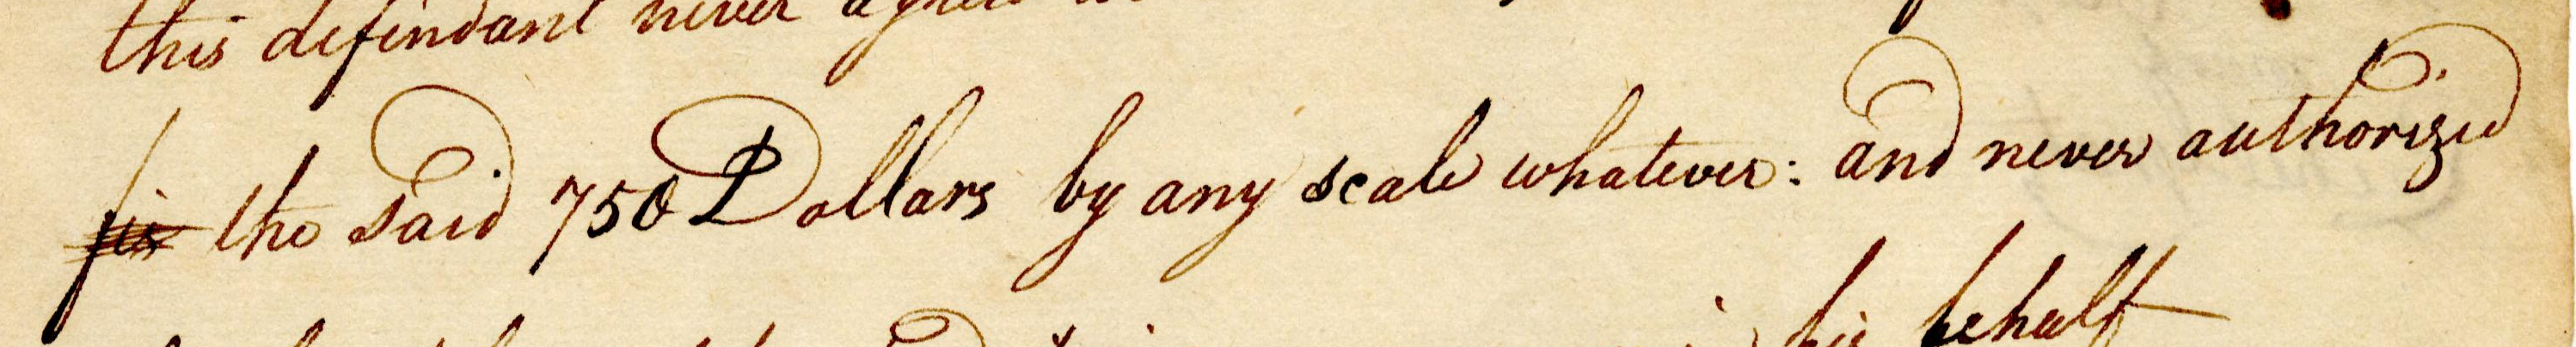[fix] the said 750 Dollars by any seals whatever. and never authorized
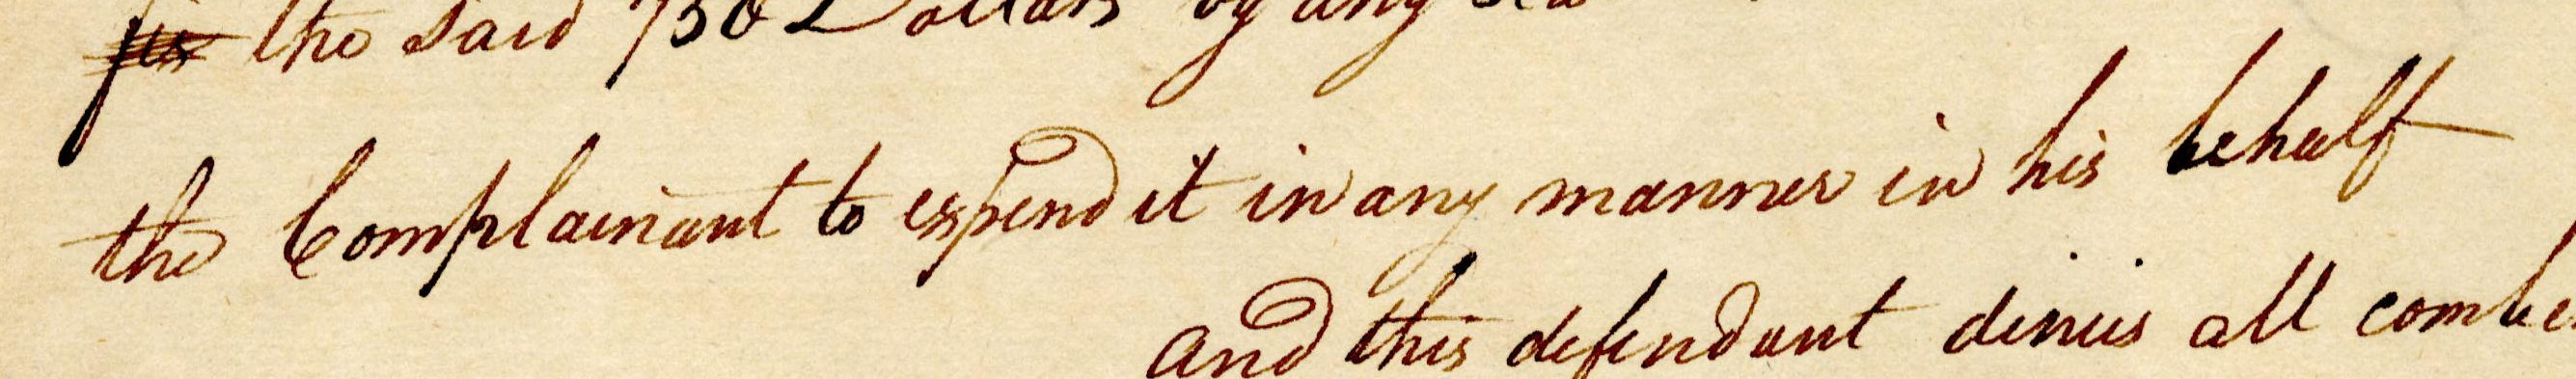the Complainant to expend it in any manner in his behelf
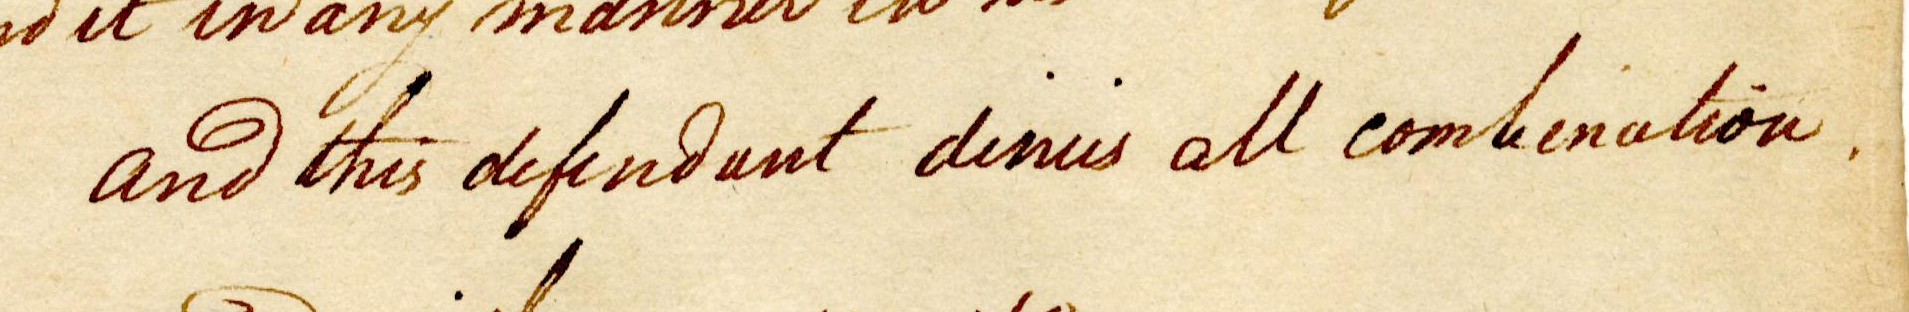and this defendant denies all combination
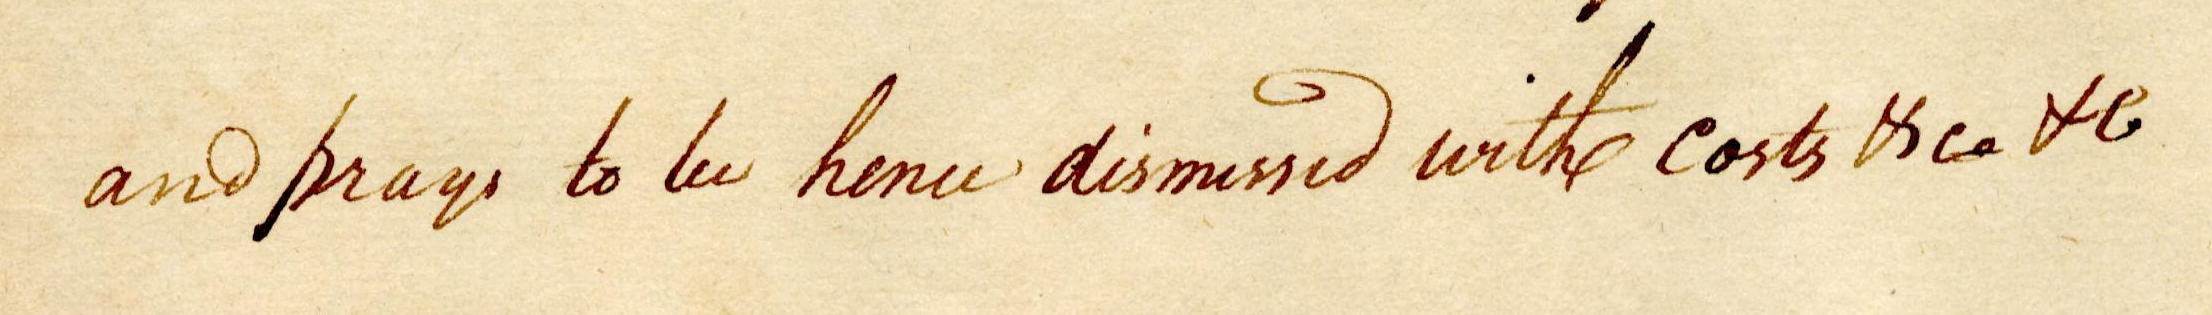and prays to be hence dismissed with costs & ce &c
